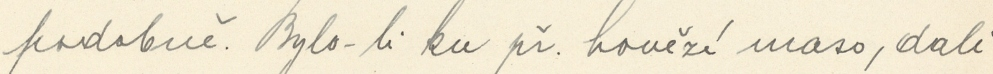podobně. Bylo-li ku př. hovězí maso, dali
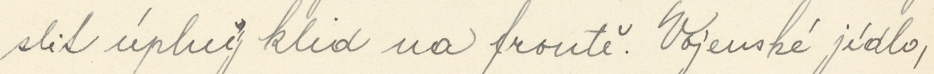slit úplný klid na frontě. Vojenské jídlo,
